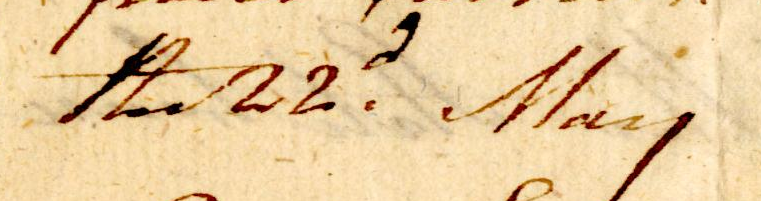the 22^d. May
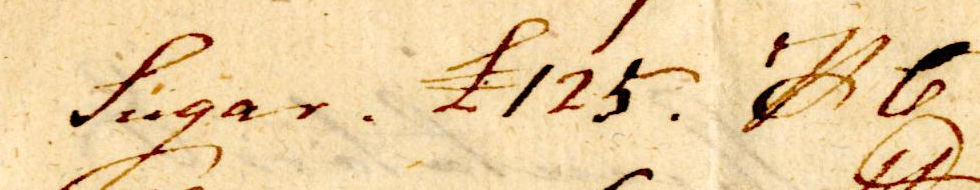Sugar. £125. per 6
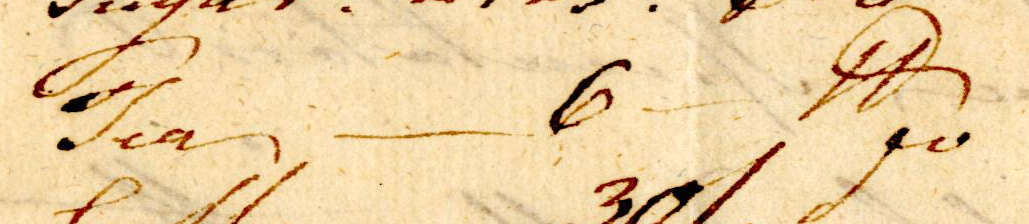Tea.- 6 per gv
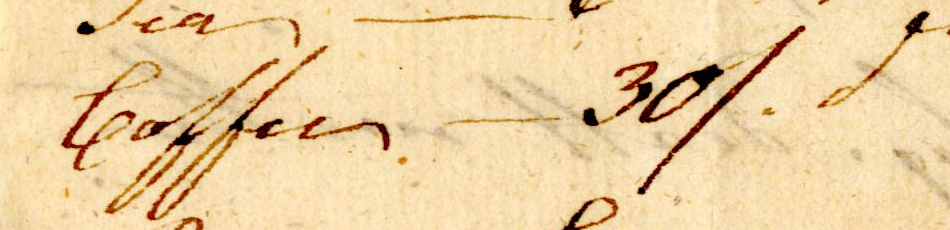coffee.- 30s
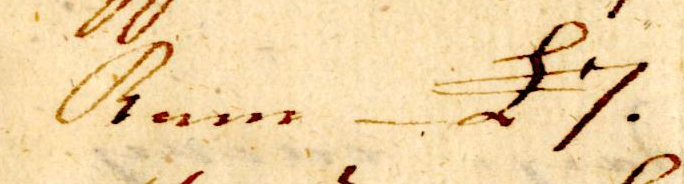Rum- £7.
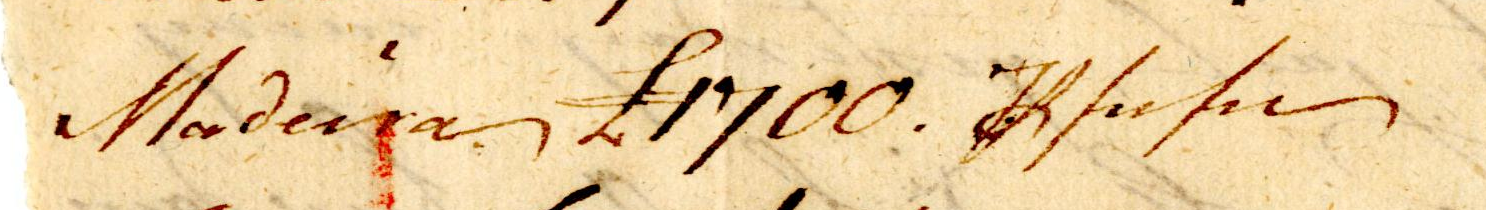Madeira, £1700 per pipe
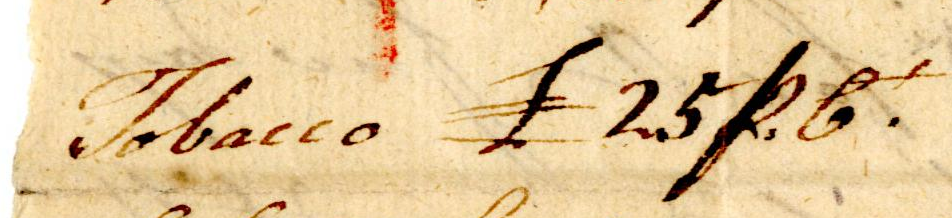Tobacco £ 25 p. 6^t.
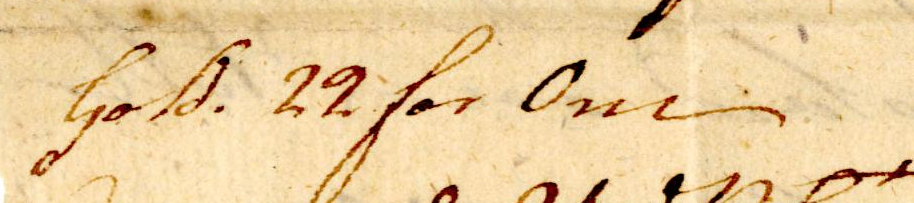Gold: 29 for one
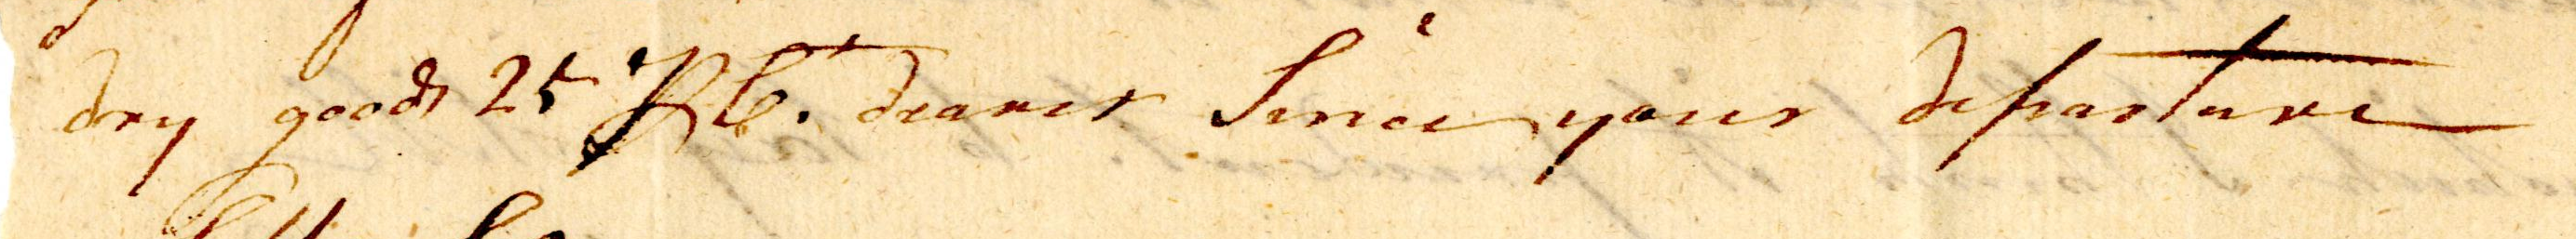dry good 25 per 6^t. dearer Since your departure
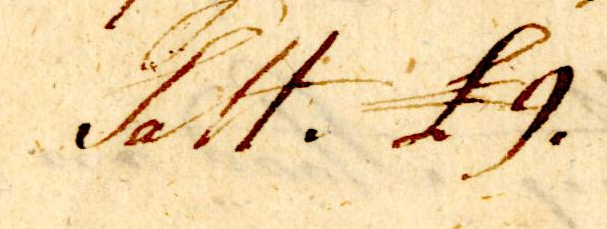Salt. £9
